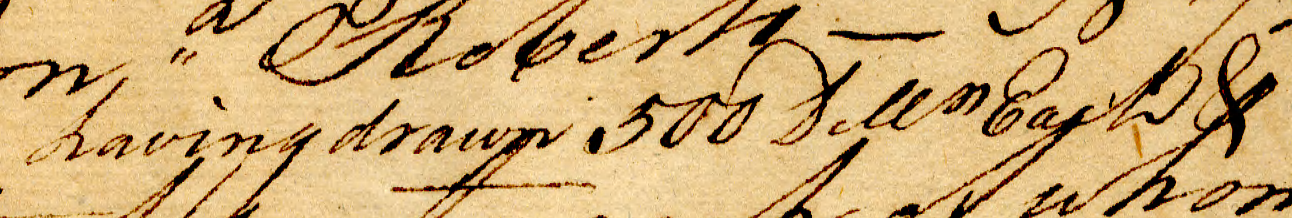having drawn 500 Doll^r Each &
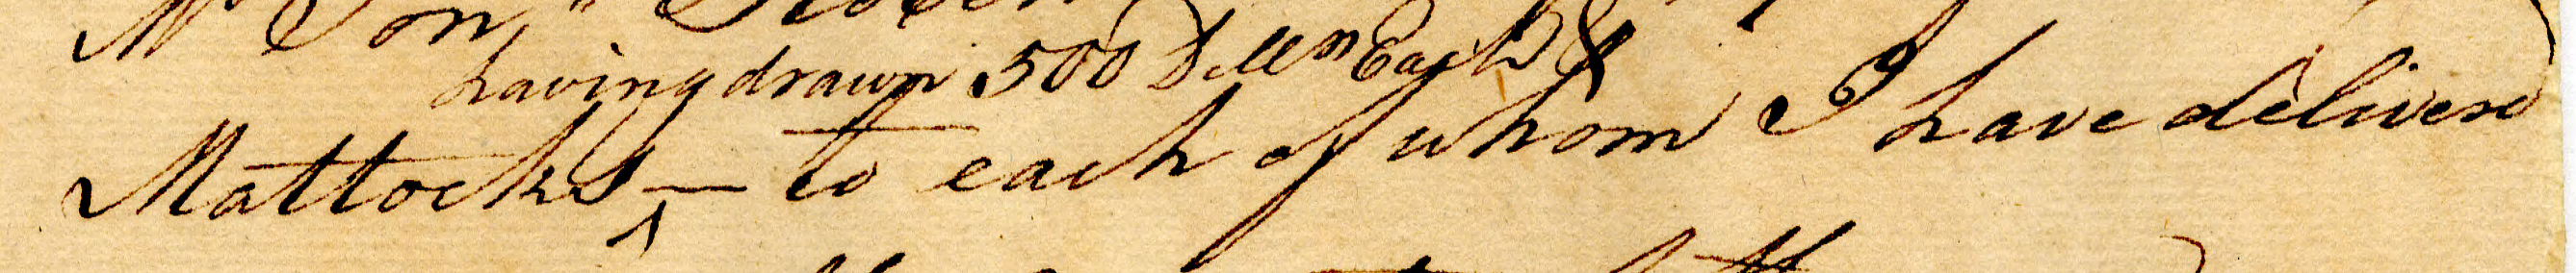Mattocks ^ - to each of whom have deliverd
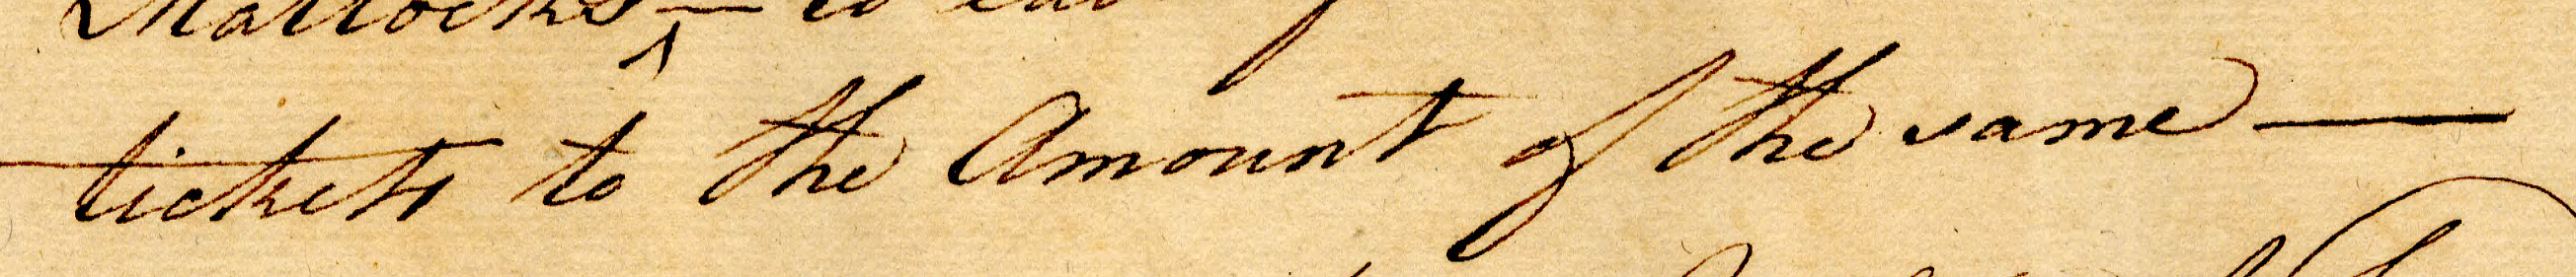tickets to the Amount of the same-
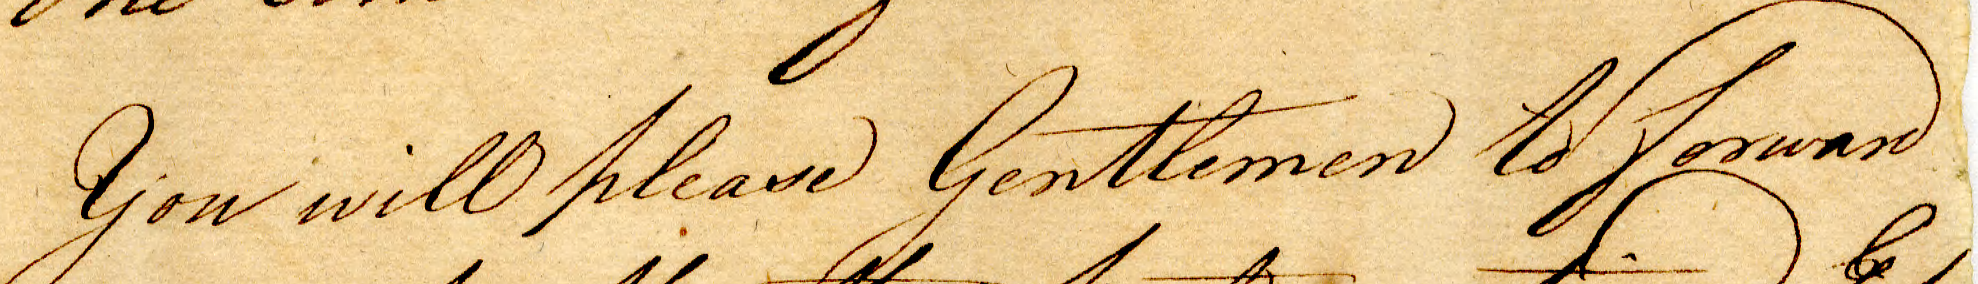You will please Gentlemen to forward
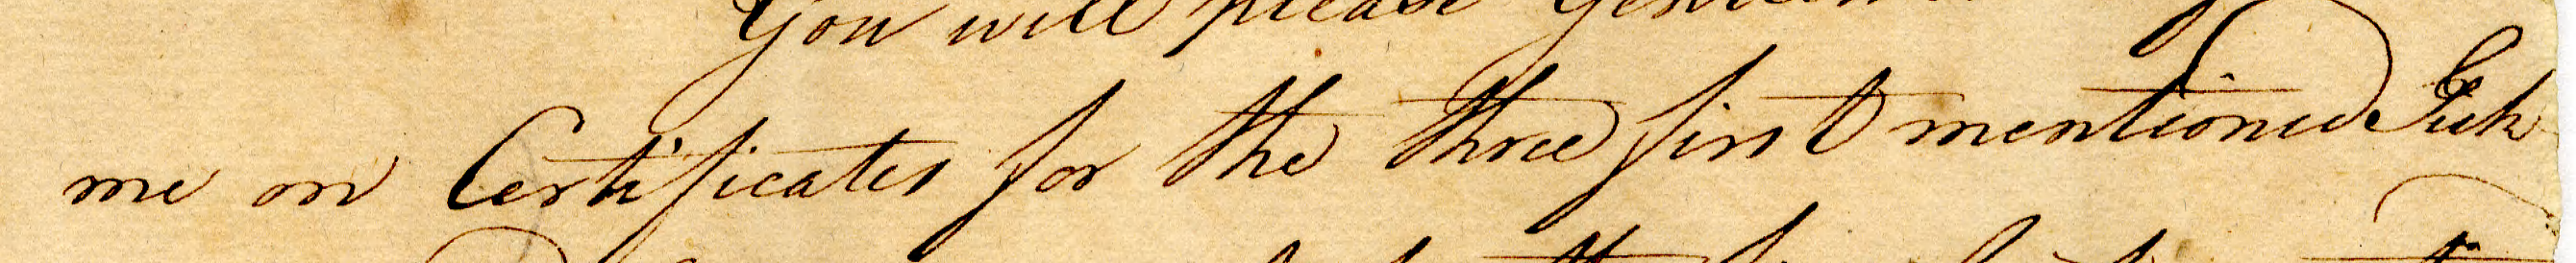me on Certificates for the three first mentioned Tick
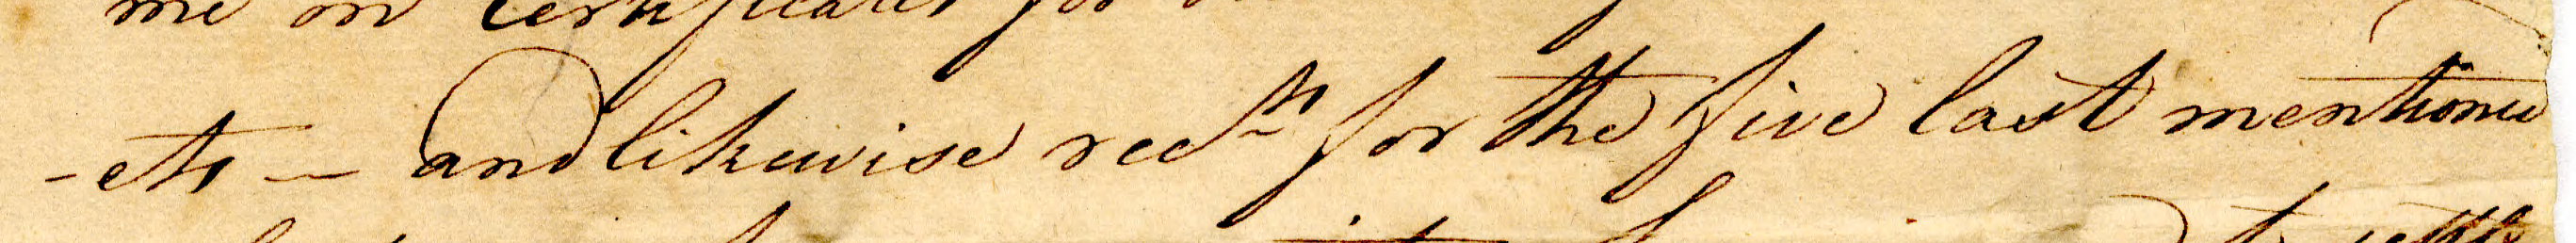-ets- and likewise rec^t for the five last mentioned
